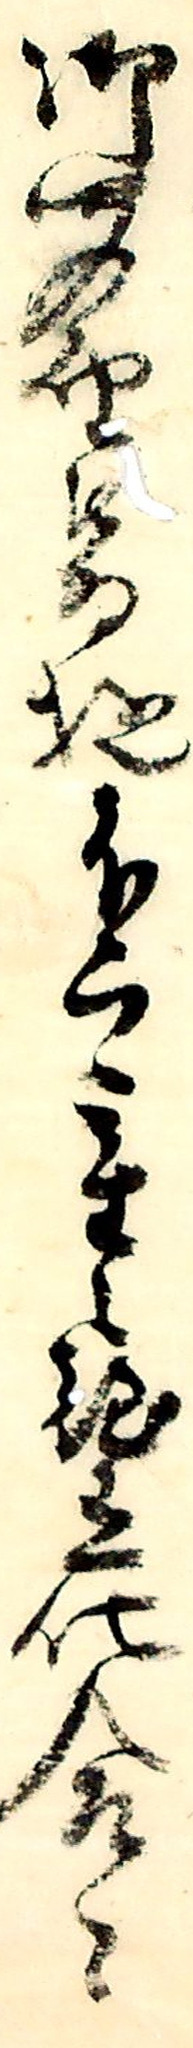御聞届被為遊被下候はゝ重々難有仕合に
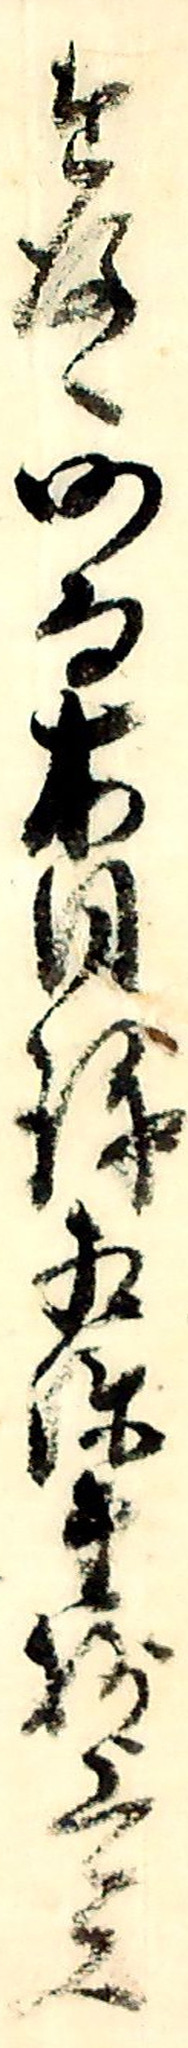奉存候仍て木目録相添奉指上候以上
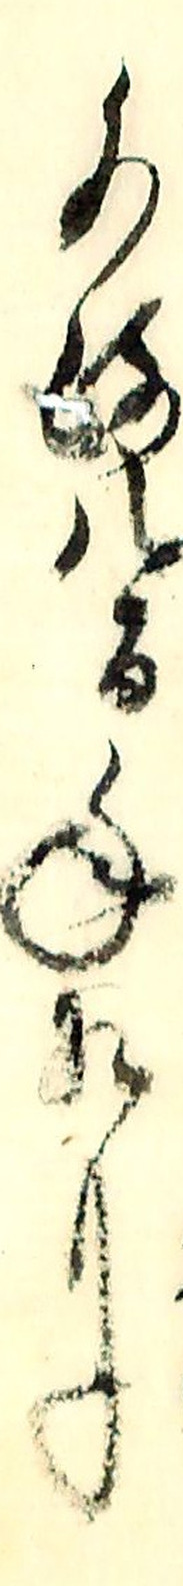文政八酉年九月
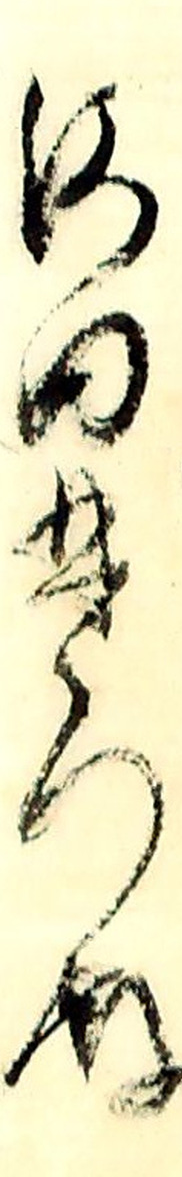沢田林右衛門殿
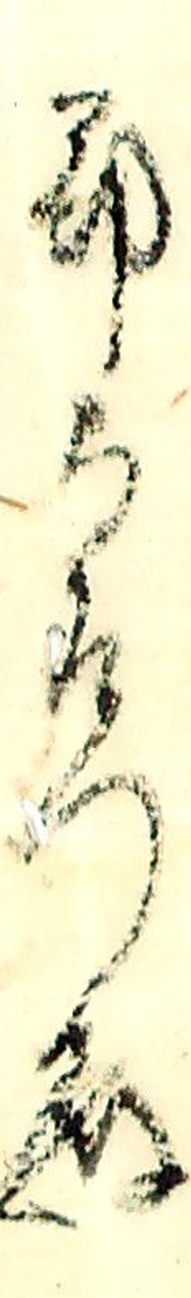郡与左衛門殿
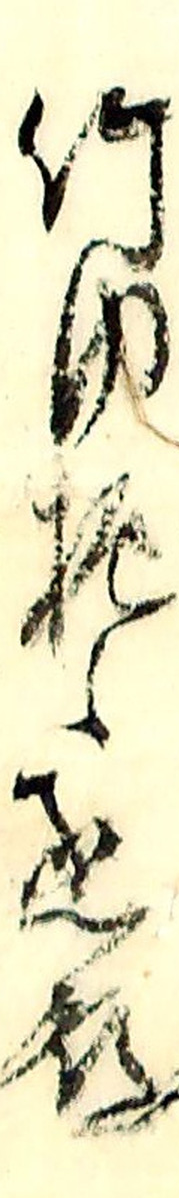竹内梶之丞殿
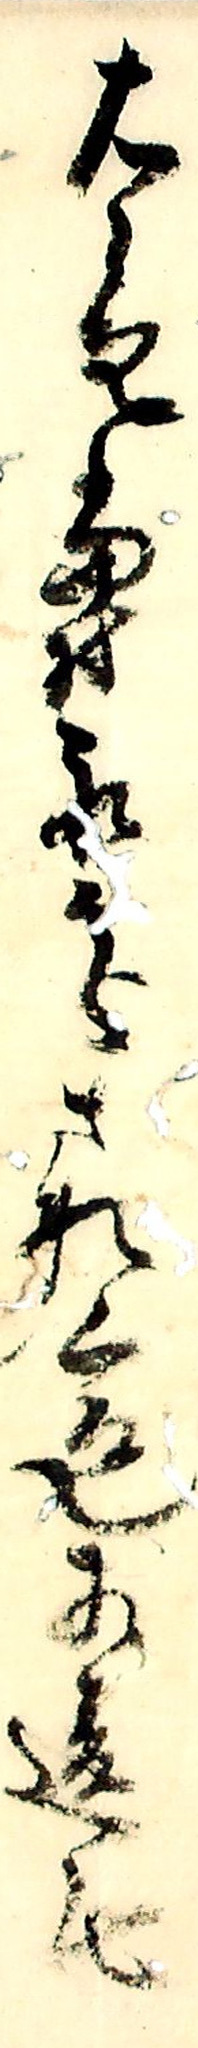右之通当村永太郎奉願上通相違無
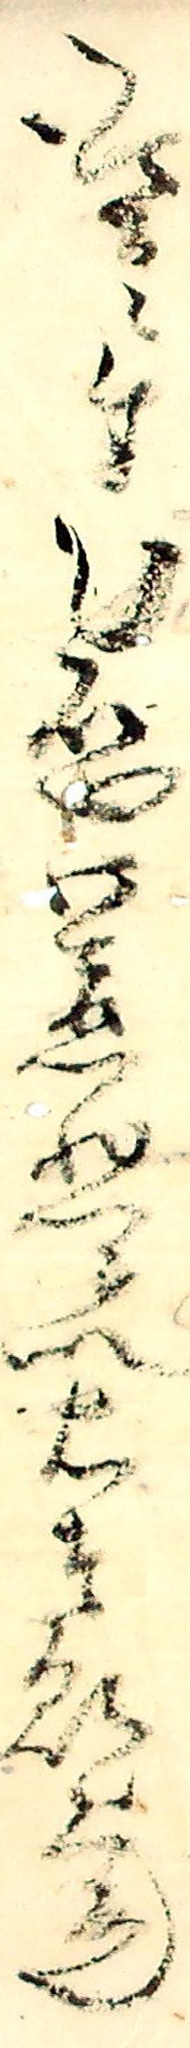御座候に付乍恐御慈悲を以右奉願上通
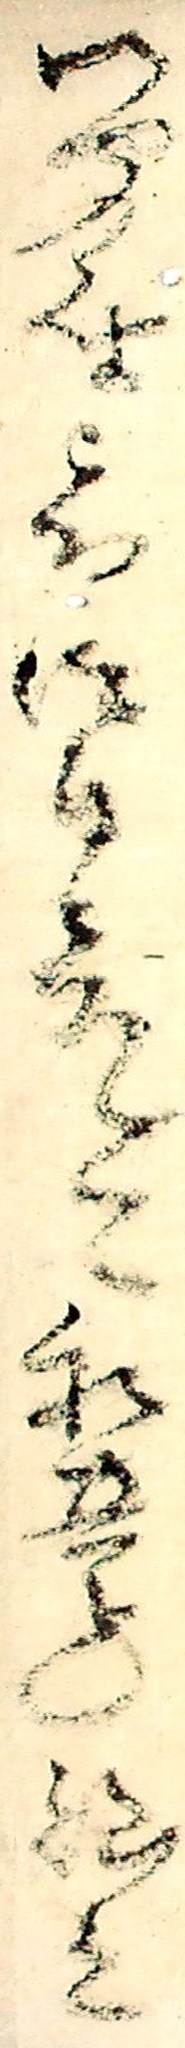御聞届被為仰付被下候はゝ私共迄難有
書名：諸御願書控(後藤氏壱番）
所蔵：鳴門教育大学 Naruto University of Education
